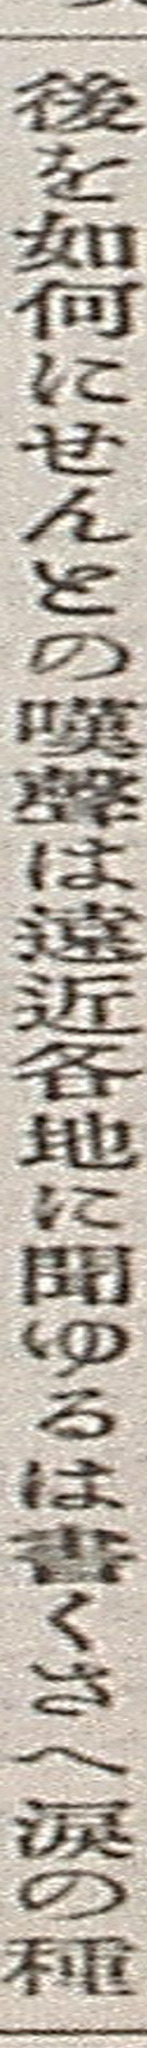後を如何にせんとの嘆声は遠近各地に聞ゆるは書くさへ涙の種
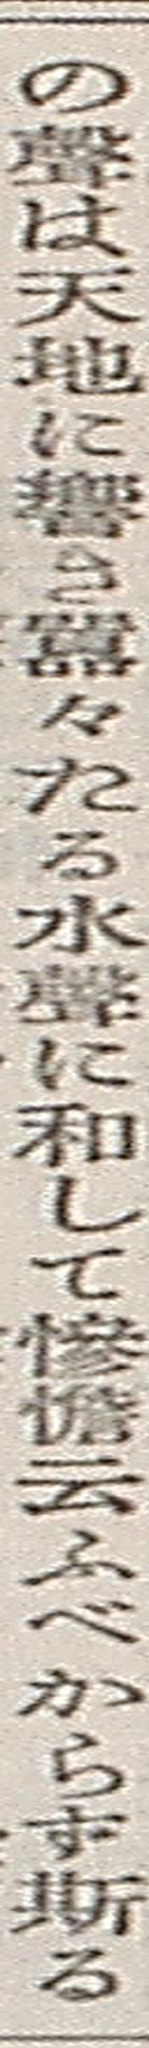の声は天地に響き轟々たる水声に和して惨憺云ふべからず斯る
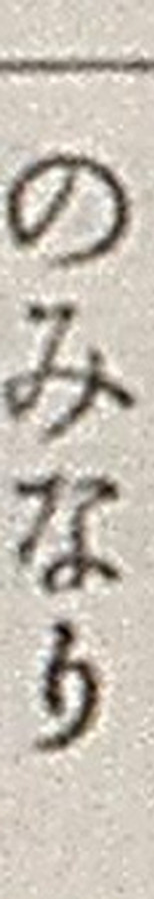のみなり
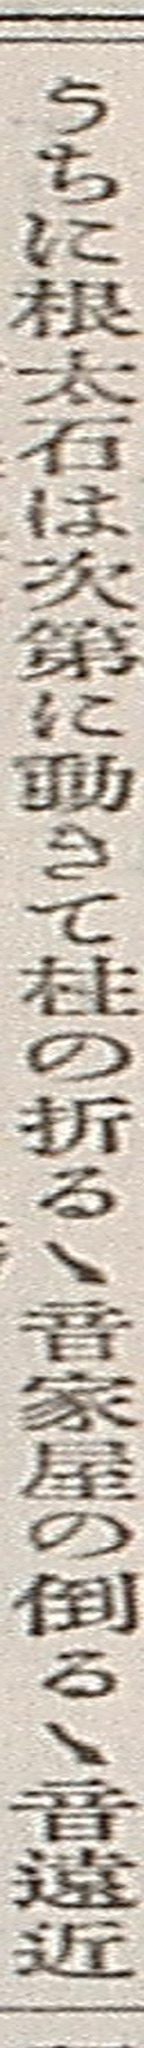うちに根太石は次第に動きて柱の折るゝ音家屋の倒るゝ音遠近
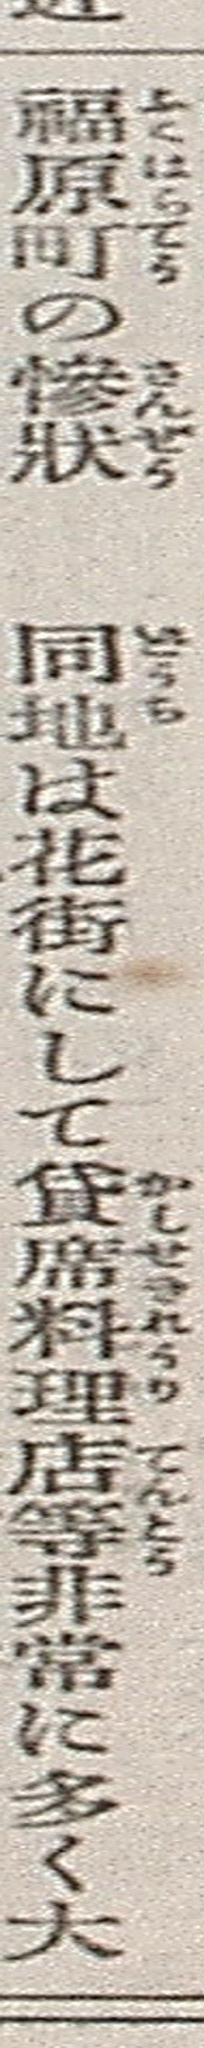福原町の惨状同地は花街にして貸席料理店等非常に多く大
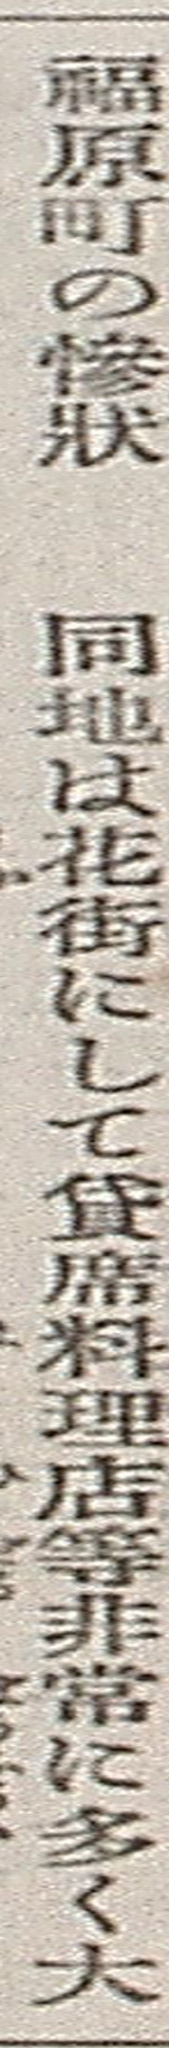福原町の惨状同地は花街にして貸席料理店等非常に多く大
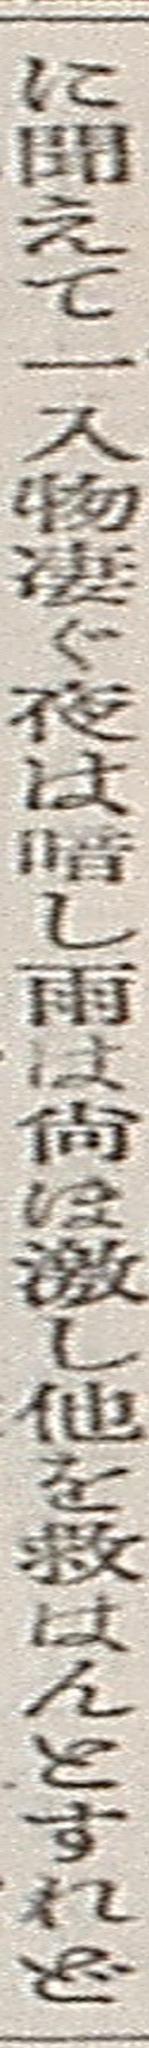に聞えて一入物凄ぐ夜は暗し雨は尚ほ激し他を救はんとすれど
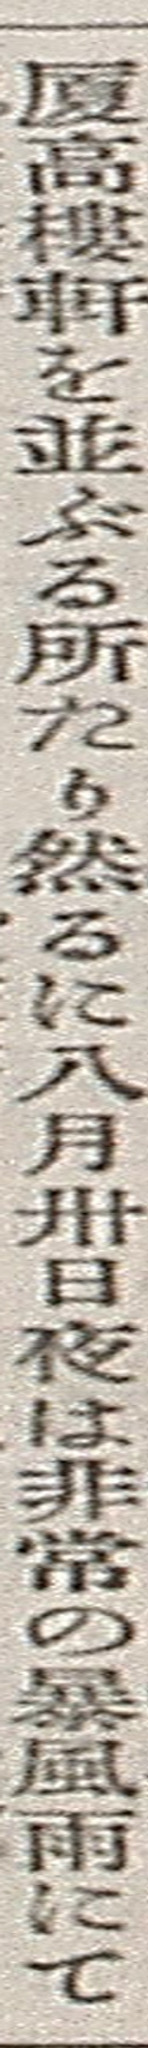層高樓軒を並ぶる所たり然るに八月卅日夜は非常の暴風雨にて
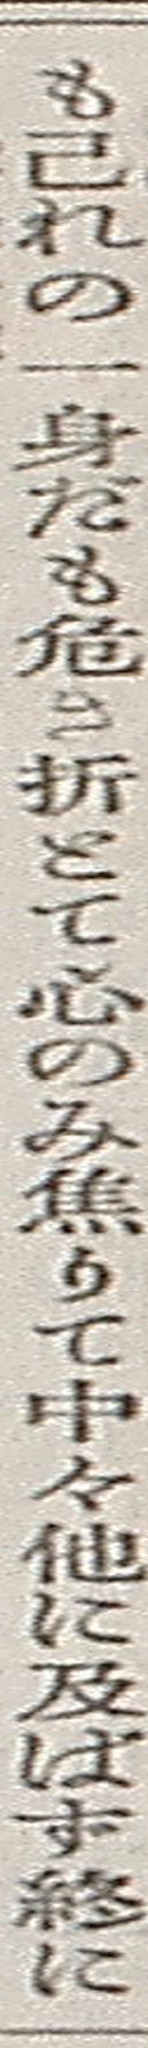も己れの一身だも危き折とて心のみ焦りて中々他に及ばず終に
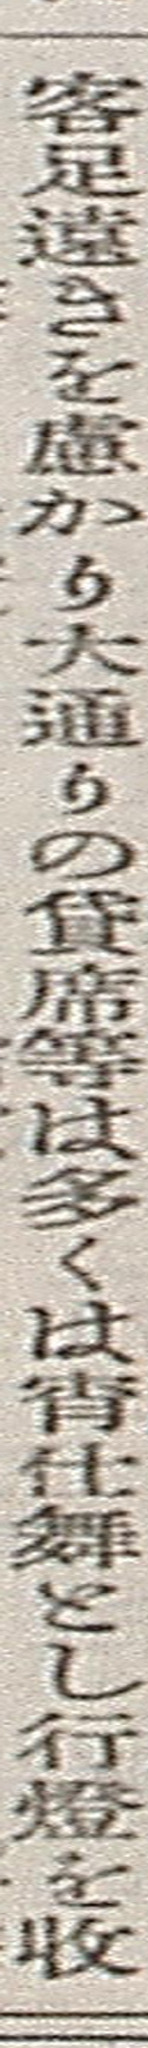客足遠きを慮かり大通りの貸席等は多くは宵仕舞とし行燈を収
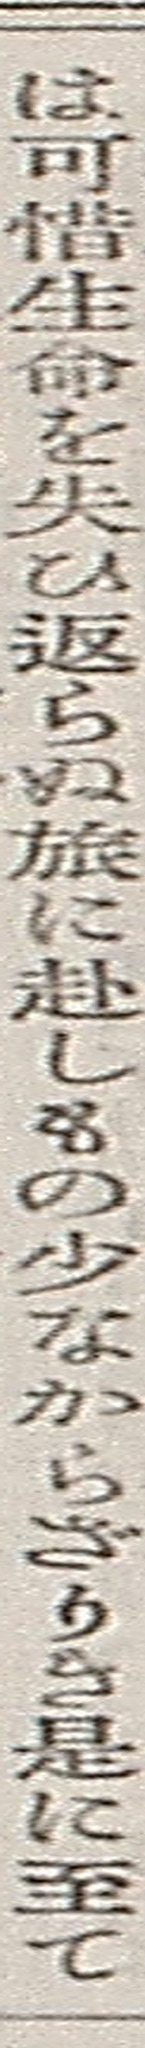は可惜生命を失ひ返らぬ旅に赴しもの少なからざりき是に至て
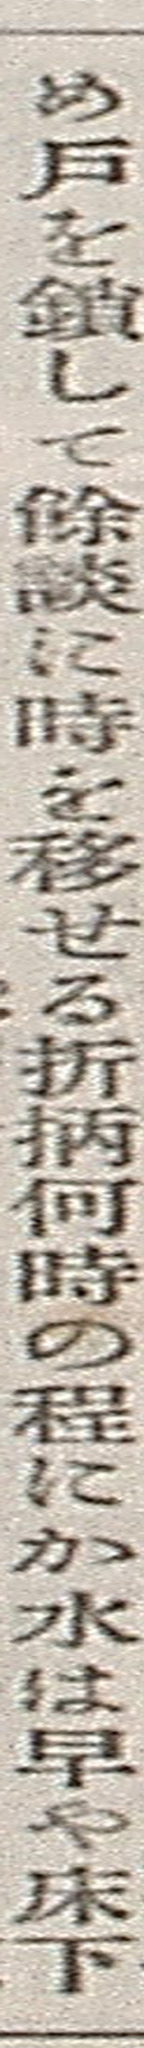め戸を鎖して餘談に時を移せる折柄何時の程にか水は早や床下
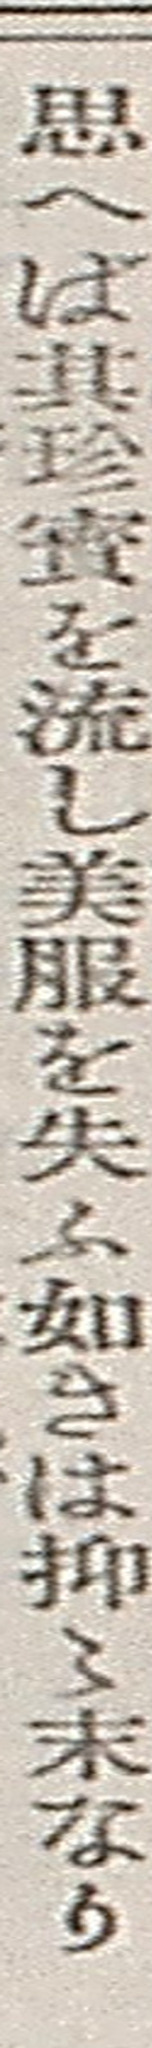思へば其珍寶を流し美服を失ふ如きは抑々末なり
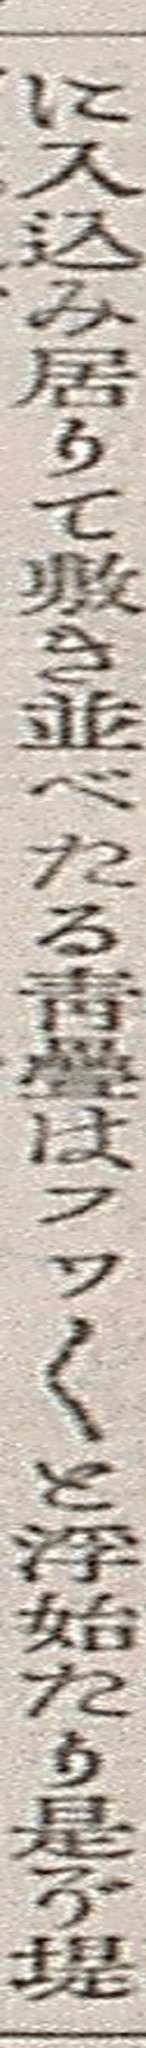に入込み居りて敷き並べたる青畳はフワ〳〵と浮始たり是ぞ堤
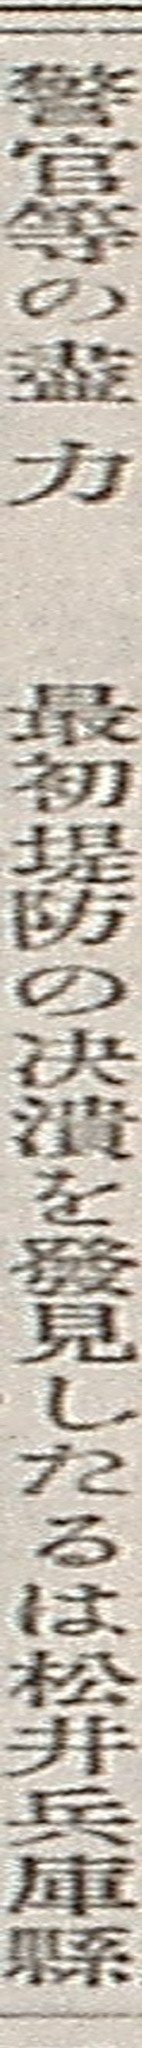警官の尽力最初堤防の決潰を発見したるは松井兵庫縣
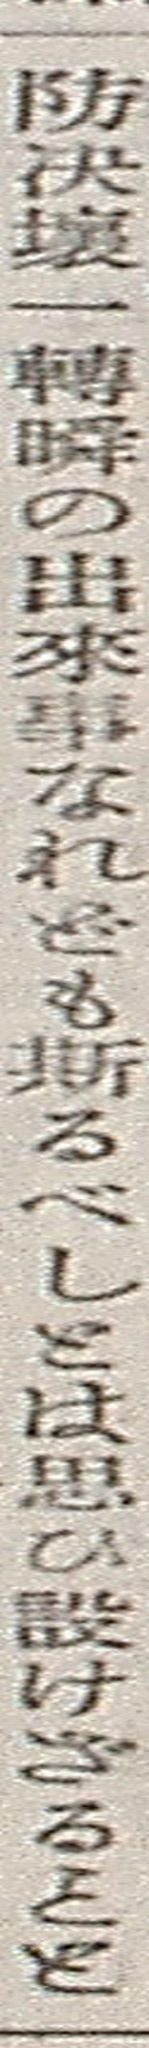防決壊一転瞬の出来事ならども斯るべしとは思ひ設かざることと
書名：風俗畫報臨時増刊第百二十八號　洪水被害録（下）
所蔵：東京大学地震研究所図書室 Earthquake Research Institute Library, The University of Tokyo, JAPAN
